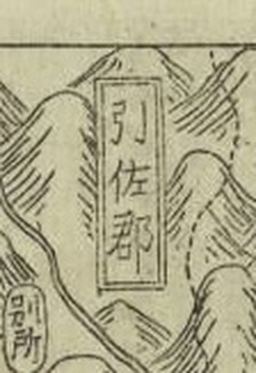引佐郡

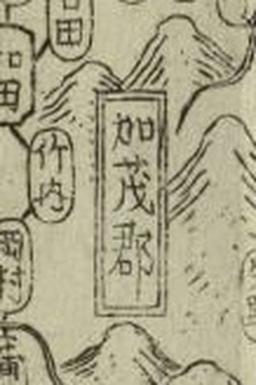加茂郡
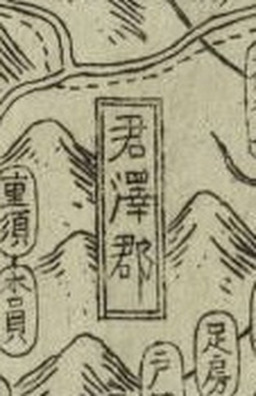君澤郡
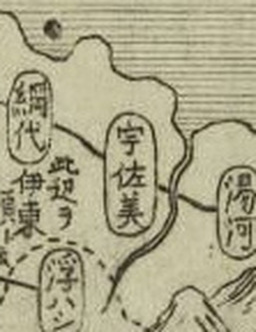宇佐美
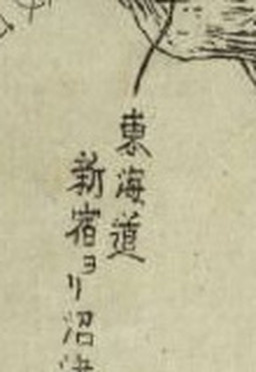東海道

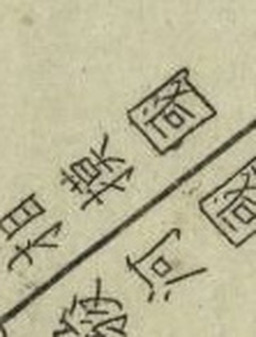相模國
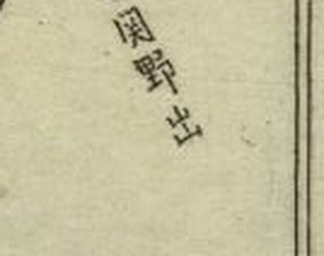岡野出
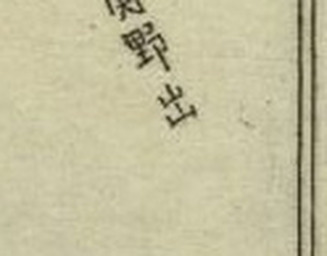岡野出
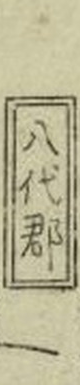八代郡
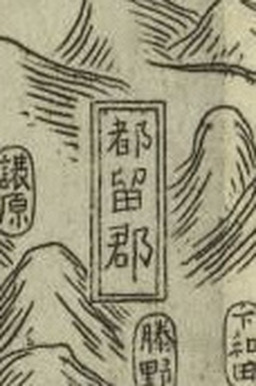都留郡
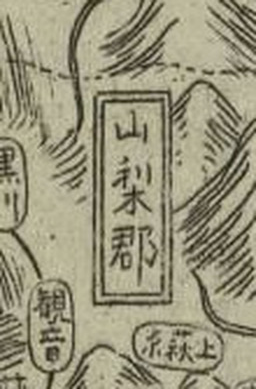山梨郡
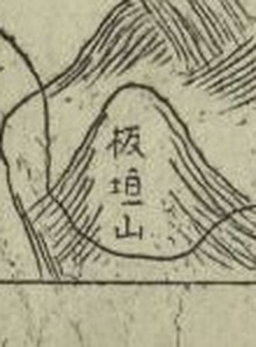板垣山

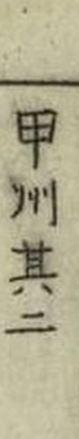甲州其二
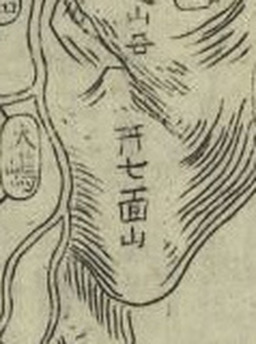下山七面山
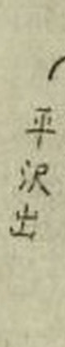平沢出

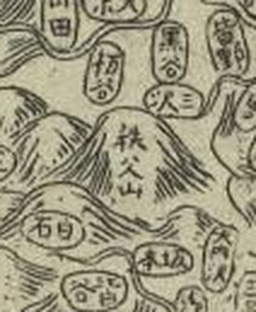秩父山
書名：大日本国細図 東国之部 上
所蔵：University of the Ryukyus Library
